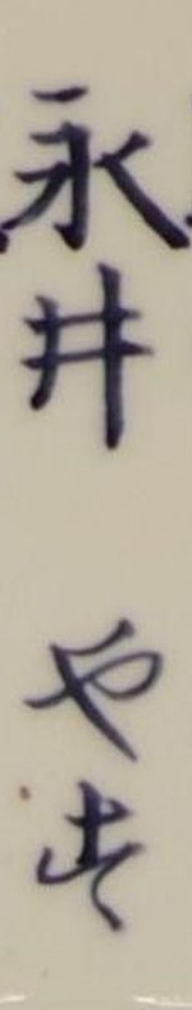永井やす
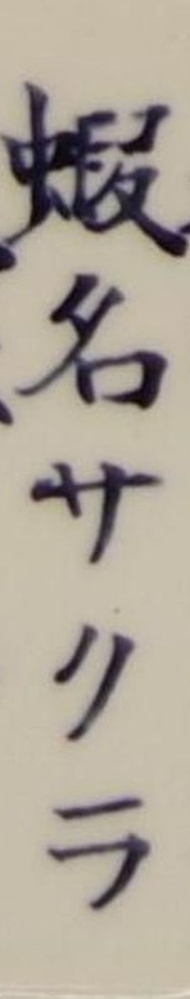蝦名サクラ
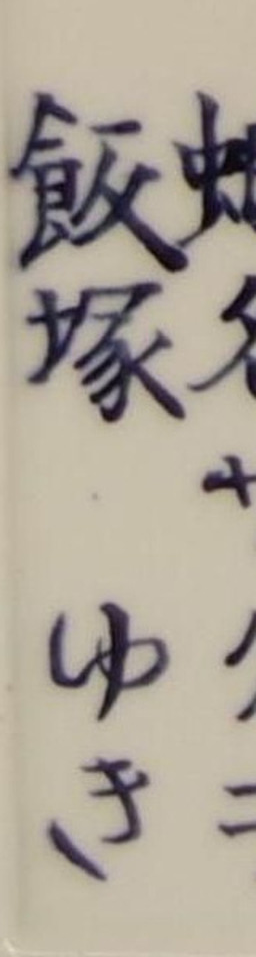飯塚ゆき

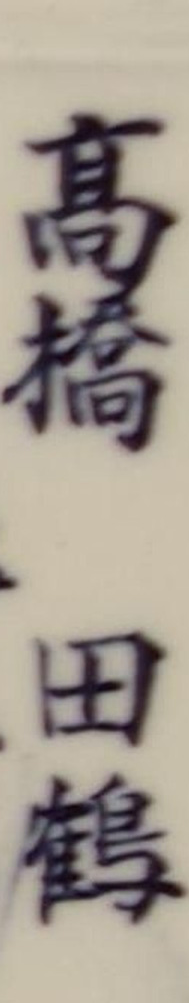高橋田鶴
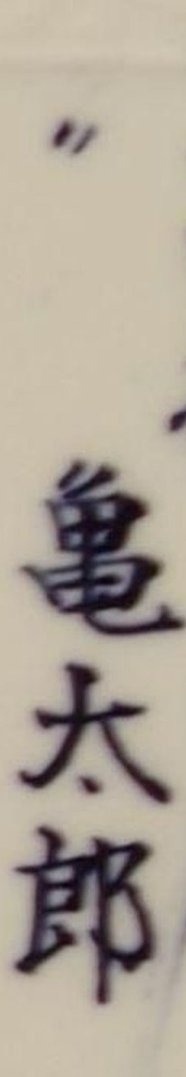亀太郎
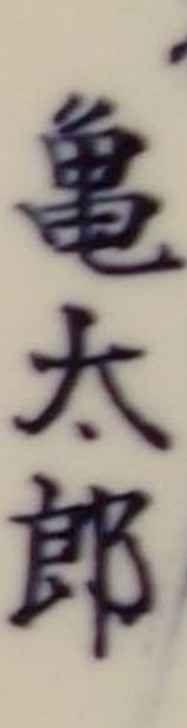亀太郎
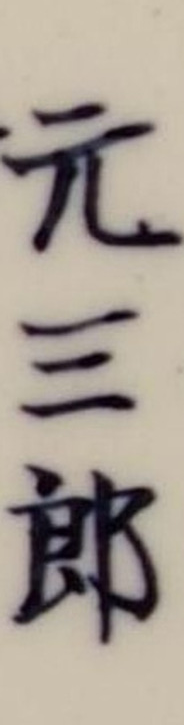元三郎
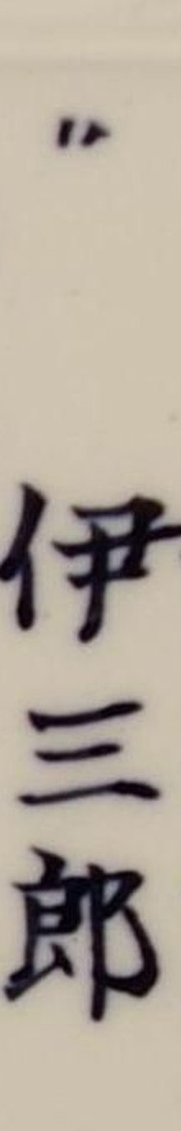伊三郎
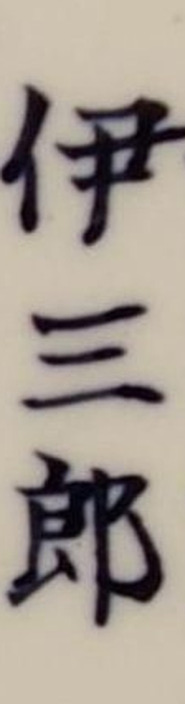伊三郎
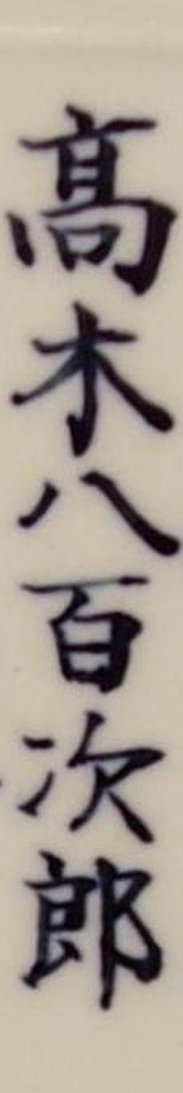高木八百次郎
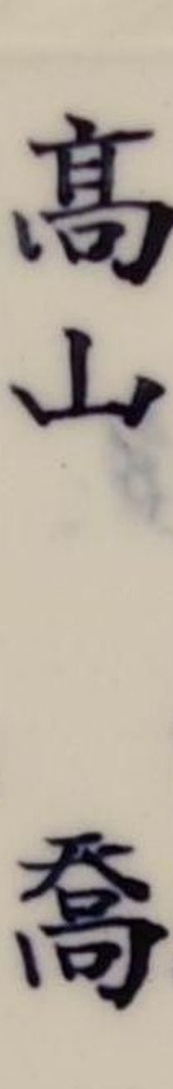高山喬
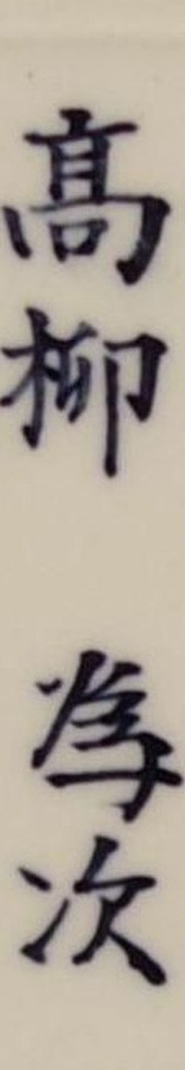高柳為次
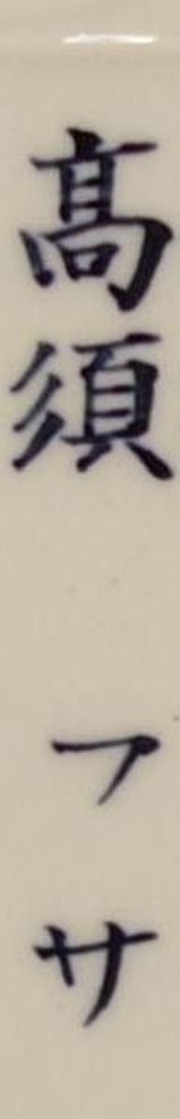高須フサ
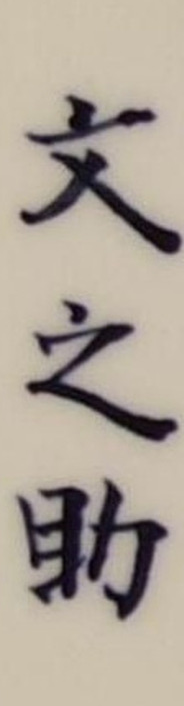文之助
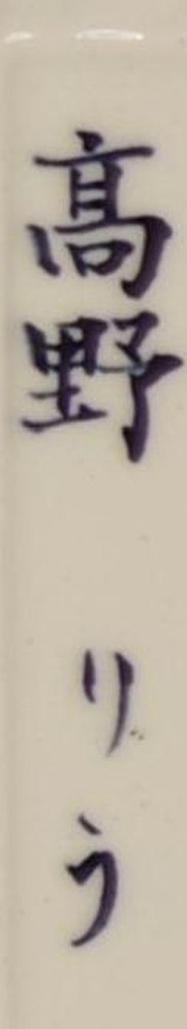高野りう

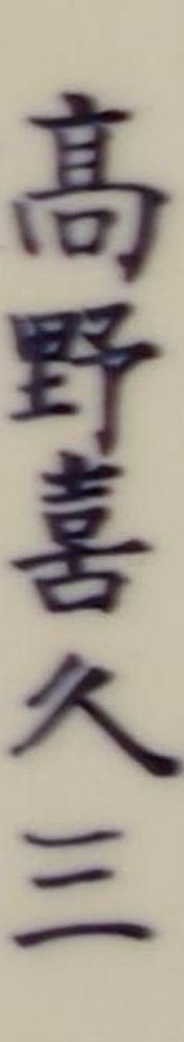高野喜久三
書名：M~S
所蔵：高野山金剛峯寺
